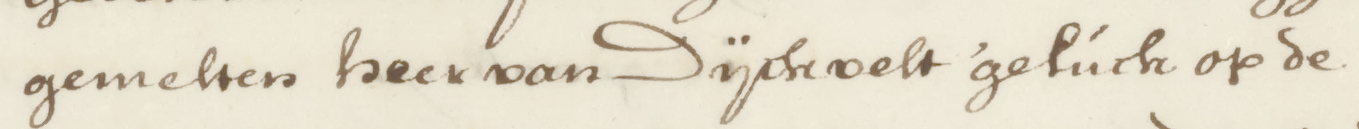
gemelten heer van Dijckvelt geluck op de
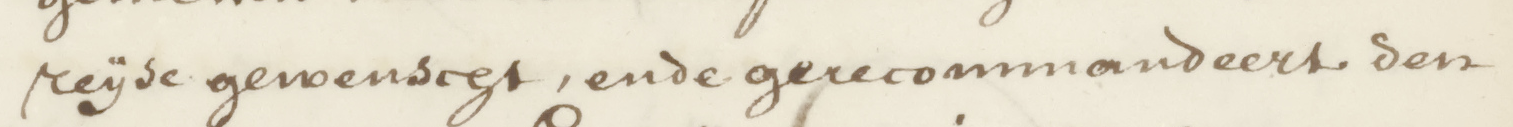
reijse gewenscht, ende gerecommandeert den
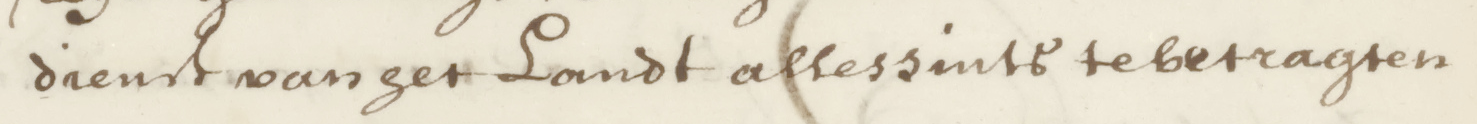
dienst van het Landt allessints te betragten
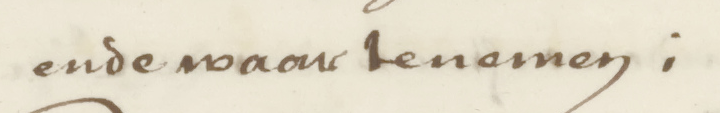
ende waar te nemen:
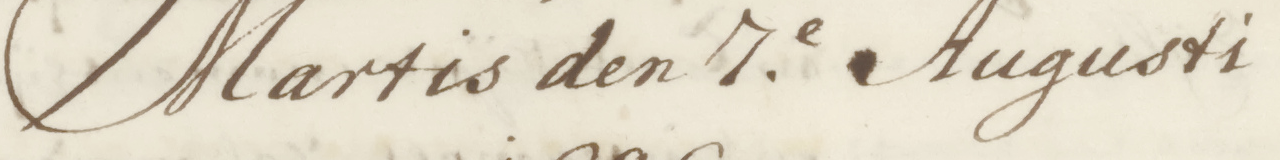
Martis den 7e. Augusti
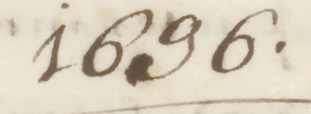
1696.
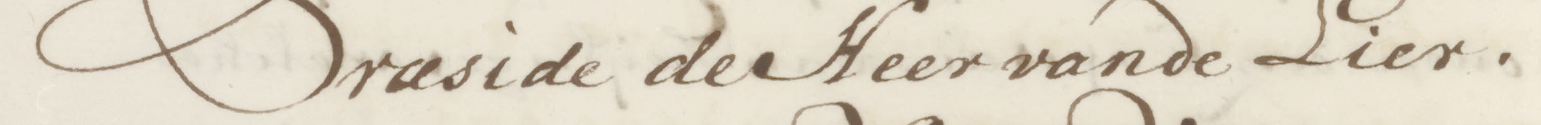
Præside de Heer vande Lier,
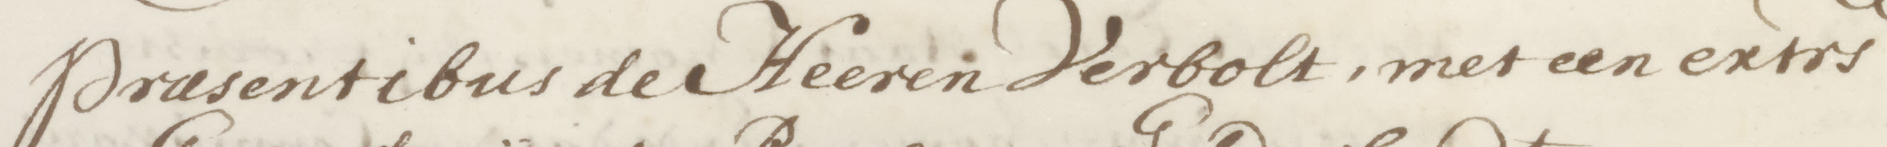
Præsentibus de Heeren Verbolt, met een extrs
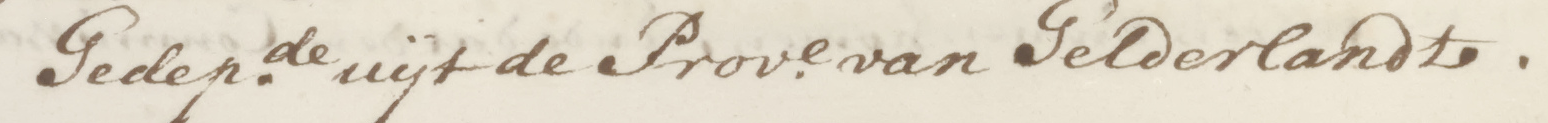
Gedepde uijt de Prove. van Gelderlandt,
